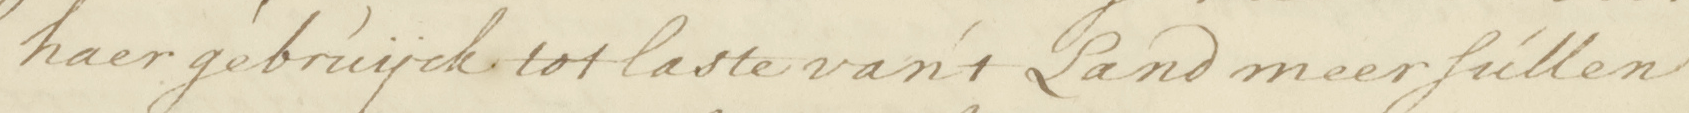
haer gebruijck tot laste van't Land meer sullen
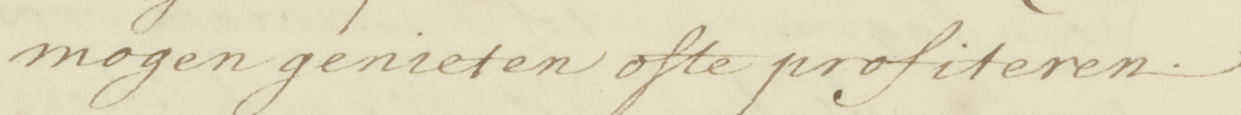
mogen genieten ofte profiteren.
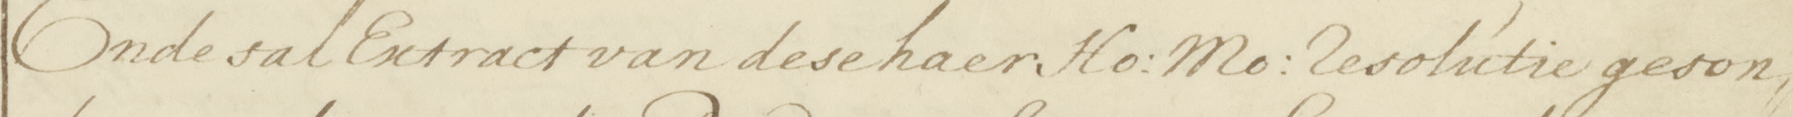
Ende sal Extract van dese haer Ho:Mo: Resolutie geson„
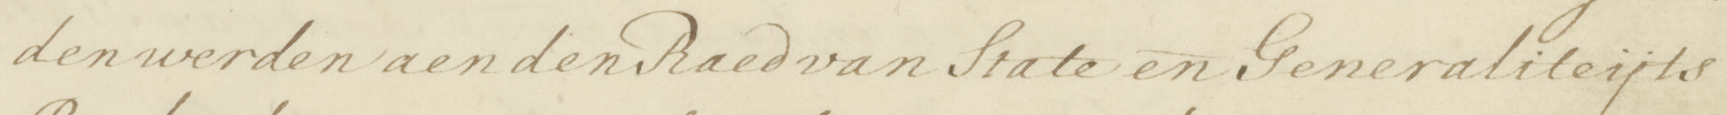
den werden aen den Raed van State en Generaliteijts
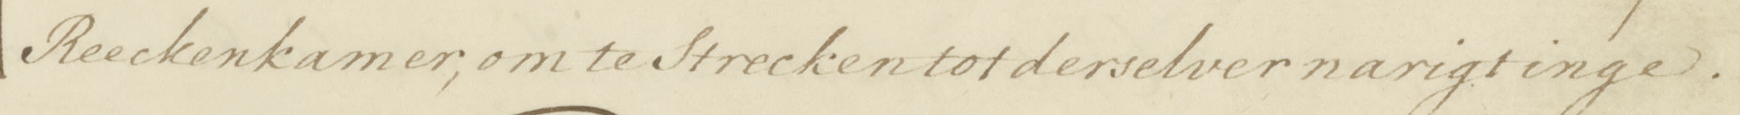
Reeckenkamer, om te strecken tot derselver narigtinge.
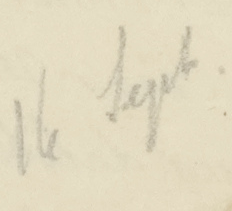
14 Sept.
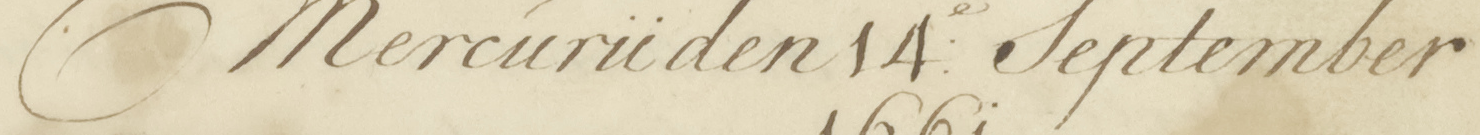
Mercurii den 14e. September
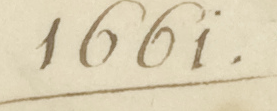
1661.
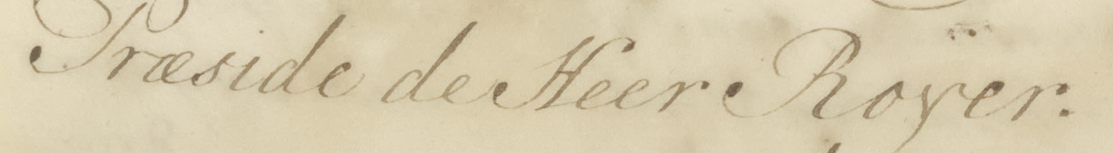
Præside de Heer Roijer.
